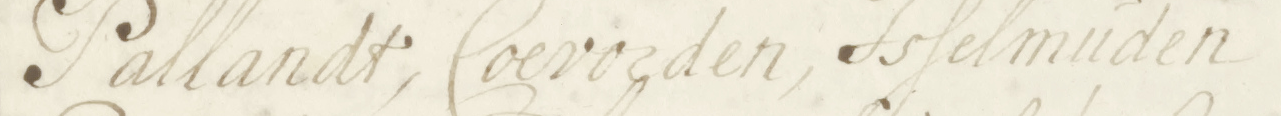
Pallandt, Coevorden, Isselmuden,
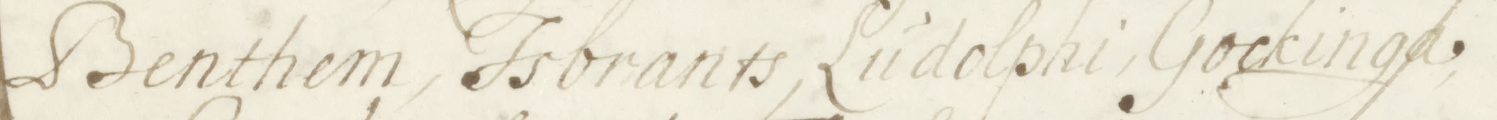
Benthem, Isbrants, Ludolphi, Gockinga,
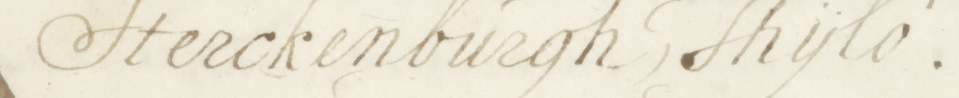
Sterckenburgh, Thijlo.
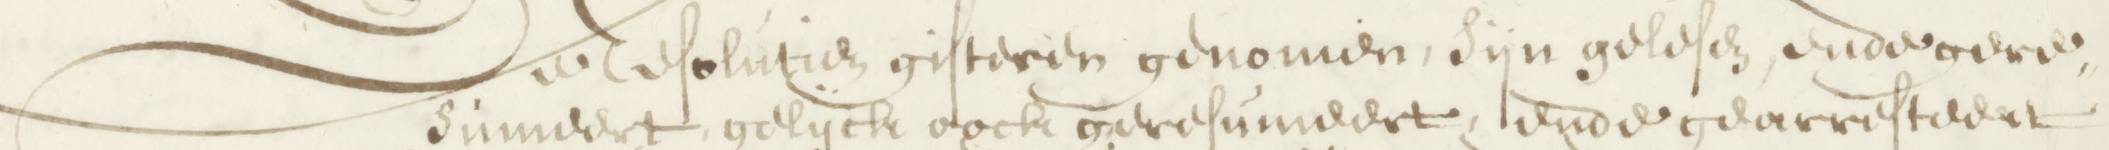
De Resolutien gisteren genomen, sijn gelesen, ende gere„
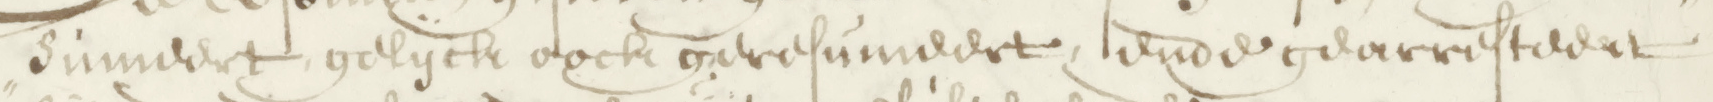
„sumeert, gelijck oock geresumeert, ende gearresteert
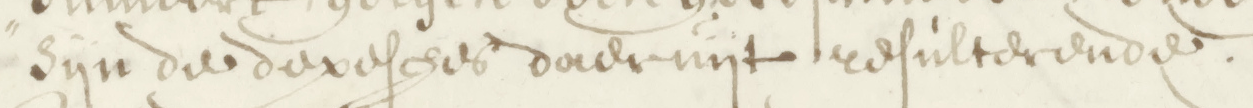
sijn de depesches daeruijt resulterende.
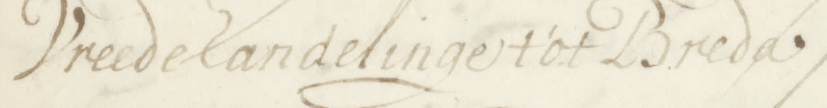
Vreedehandelinge tot Breda
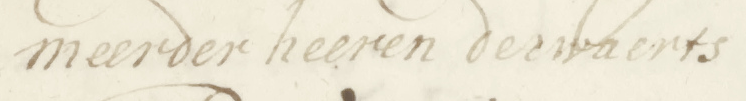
meerder heeren derwaerts
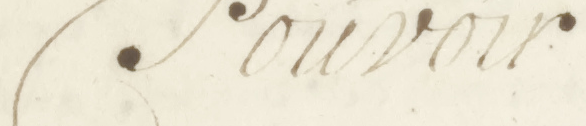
Pouvoir.
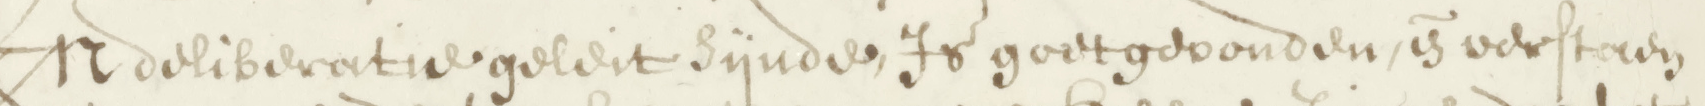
In deliberatie geleit sijnde, Is goetgevonden, en verstaen
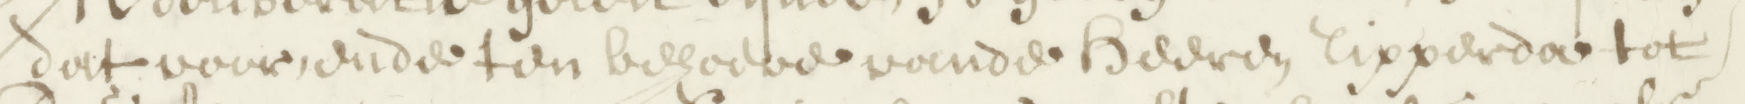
dat voor ende ten behoeve vande Heeren Ripperda tot
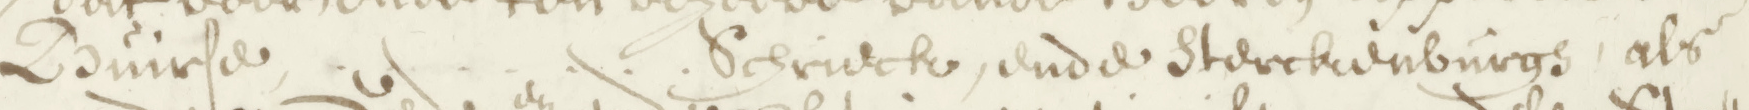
Buirse, Schrieck, ende Sterckenburgh, als
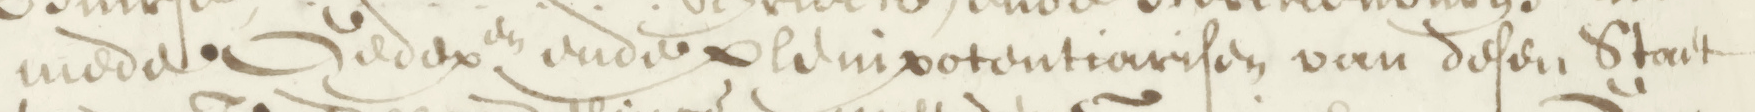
mede Gedepen ende plenipotentiarisen van desen Staet
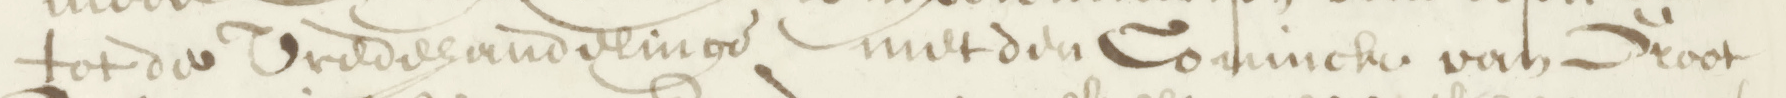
tot de Vredehandelinge met den Coninck van Groot
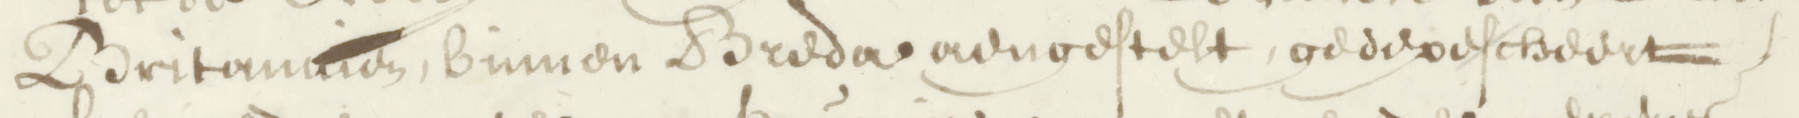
Britannien, binnen Breda aengestelt, gedepescheert
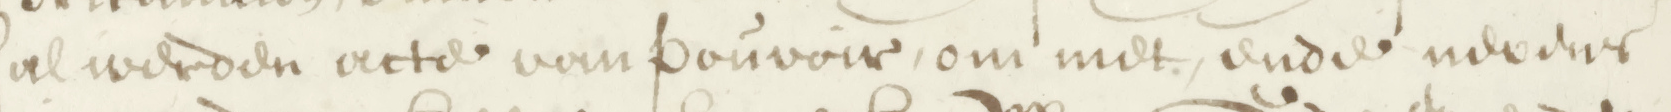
sal werden acte van Pouvoir, om met, ende nevens
